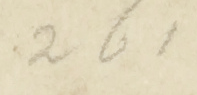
261
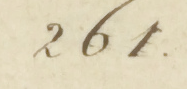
261.
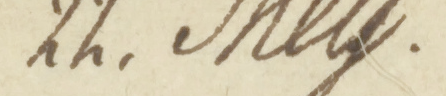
22. Mey.
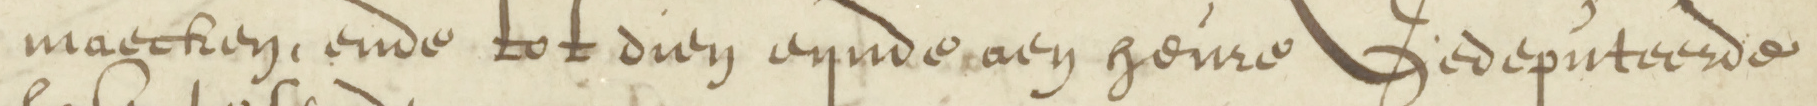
maecken, ende tot dien eynde aen heure Gedeputeerde
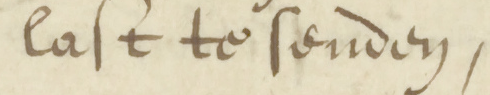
last te senden.
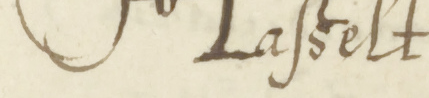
Hasselt
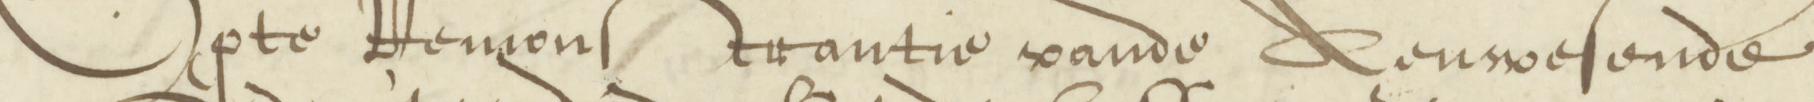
Opte Remonstrantie vande aenwesende
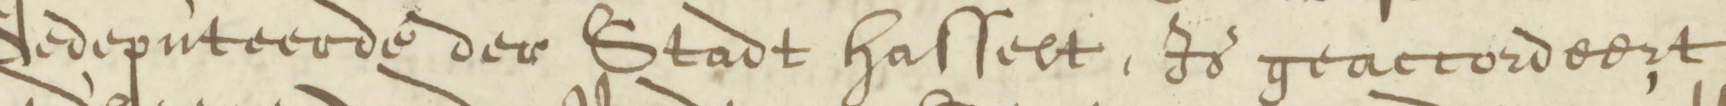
Gedeputeerde der Stadt Hasselt, Is geaccordeert
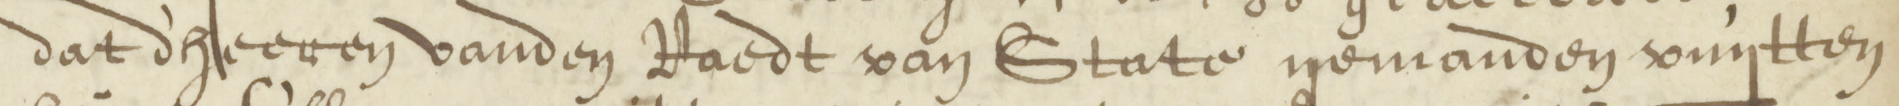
dat d'heeren vanden Raedt van State yemanden vuytten
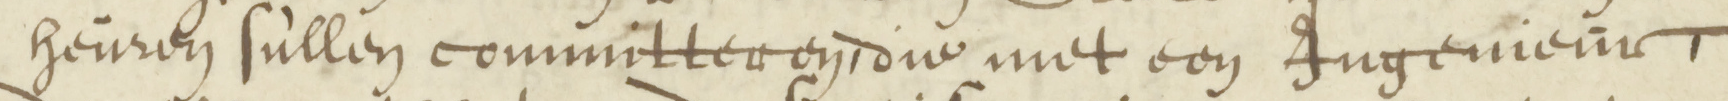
heuren sullen committeren, die met een Ingenieur
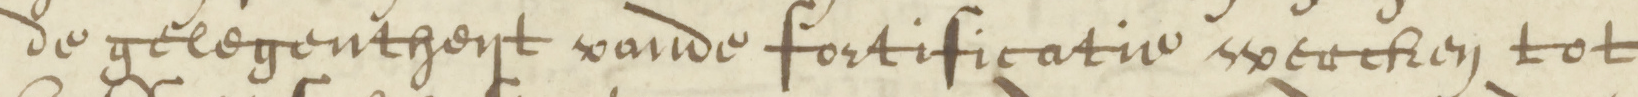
de gelegentheyt vande fortificatie wercken tot
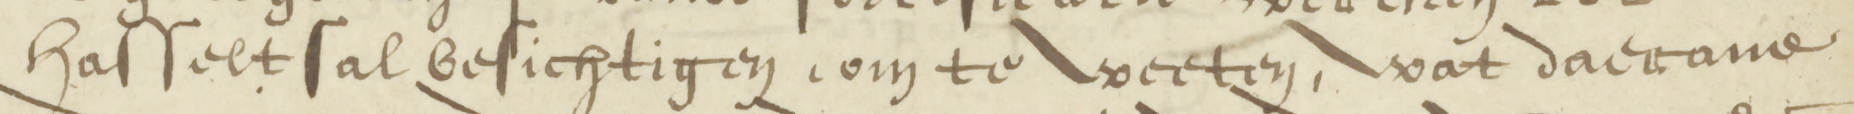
Hasselt sal besichtigen, om te weeten, wat daerane
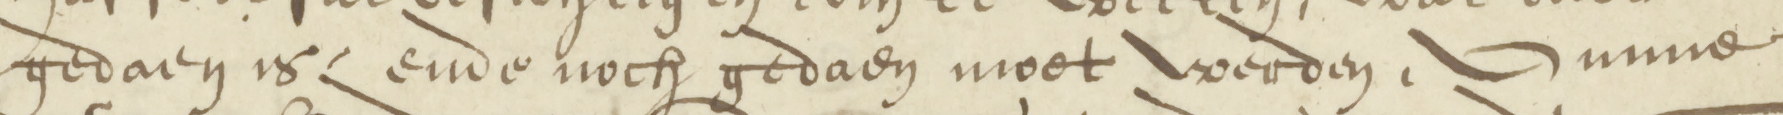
gedaen is, ende noch gedaen moet werden, Omme
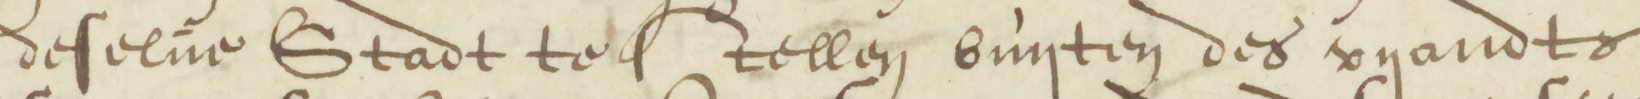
deselue Stadt te stellen buyten des vyandts
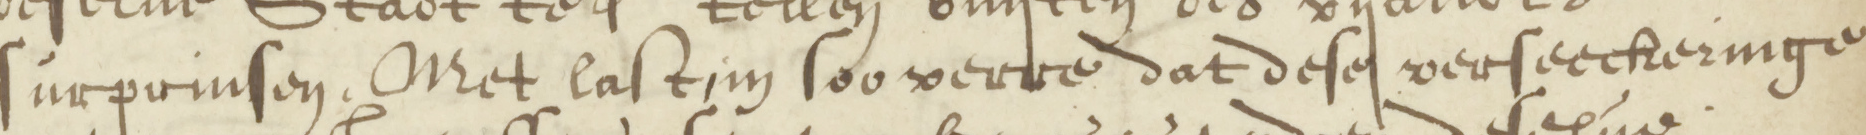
surprinsen, met last, im soo verre dat dese verseeckeringe
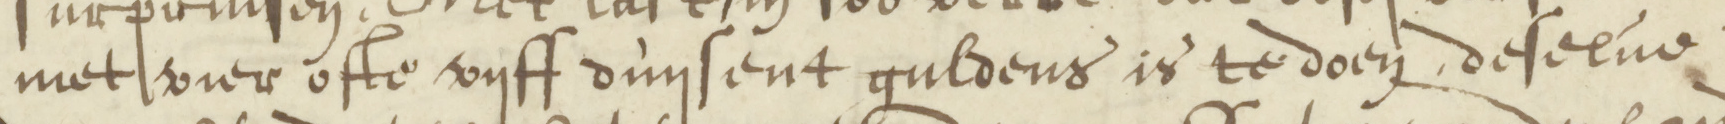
met vier ofte vyff duysent guldens is te doen, deselue
